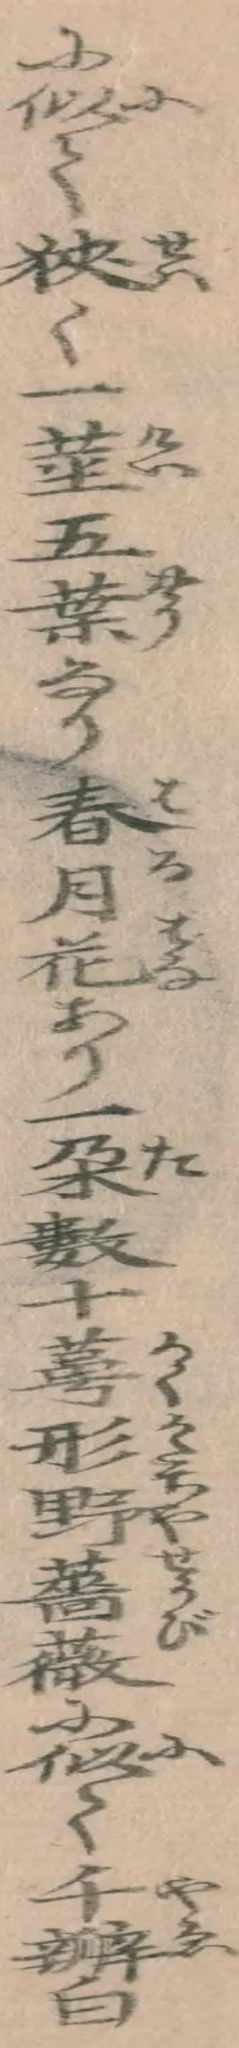に似て狭く一茎五葉なり春月花あり一朶数十萼形野薔薇に似て千弁白
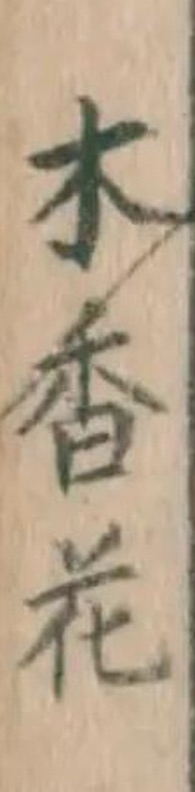木香花

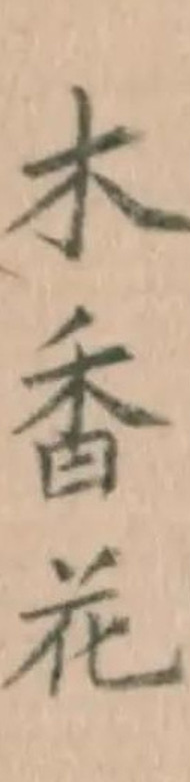木香花
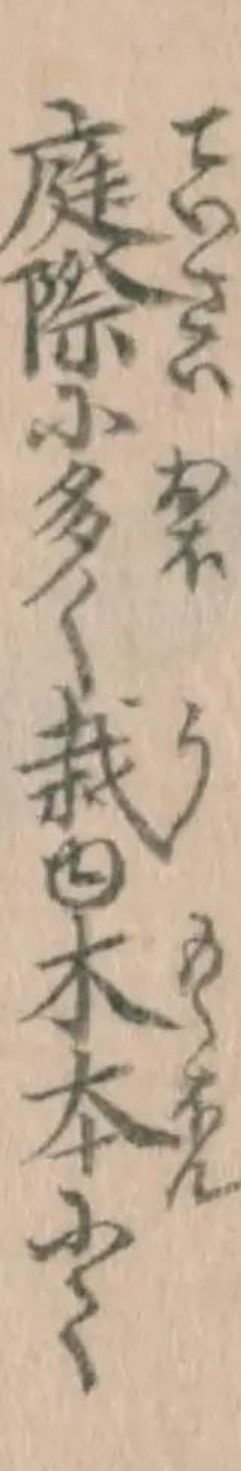庭際に多く栽ゆ木本にて
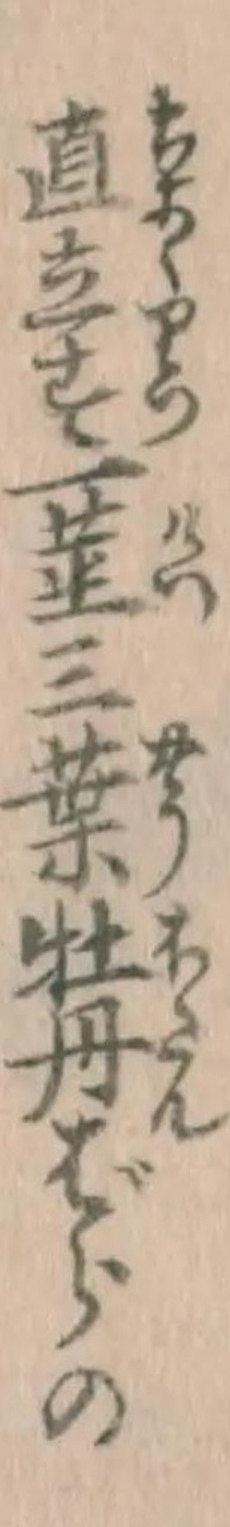直立す一茎三葉牡丹ばらの
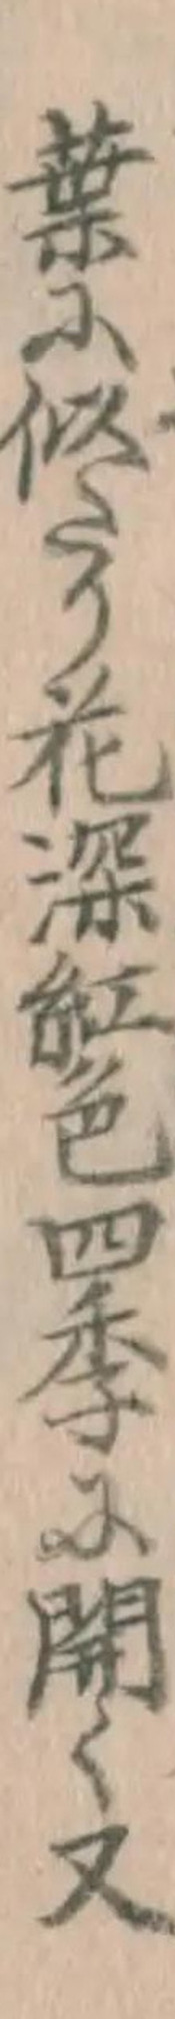葉に似たり花深紅色四季に開く又
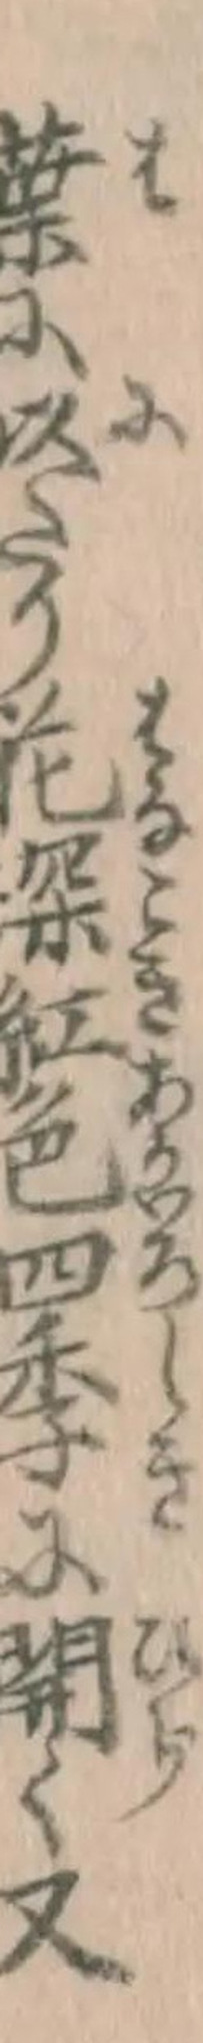葉に似たり花深紅色四季に開く又
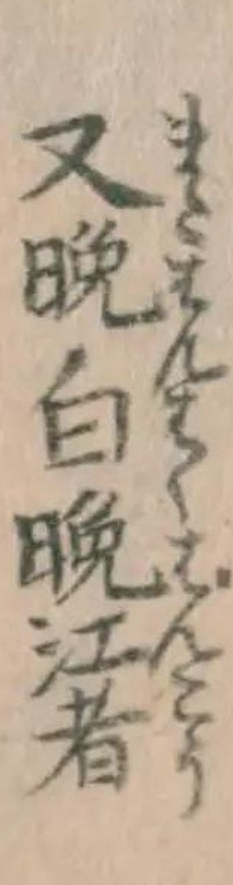又晩白晩江者
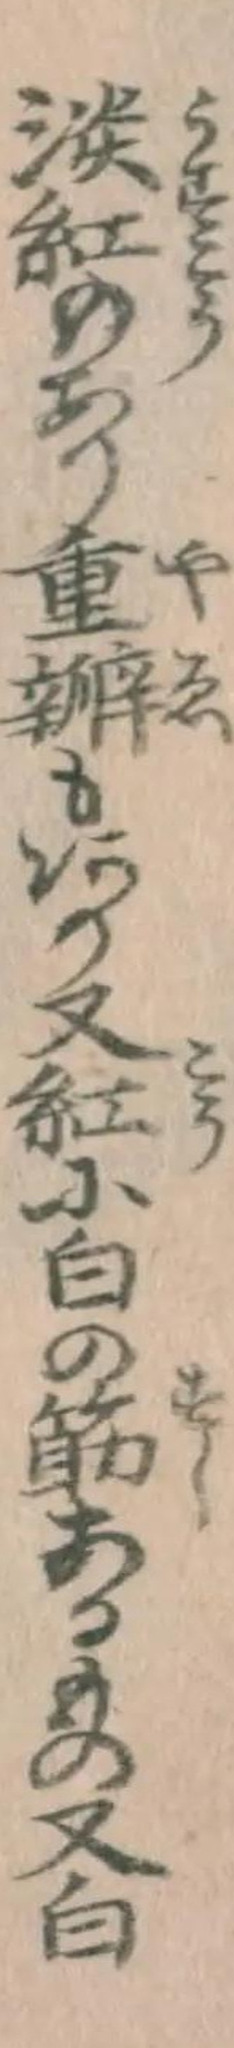淡紅もあり重弁もあり又紅に白の筋あるもの又白
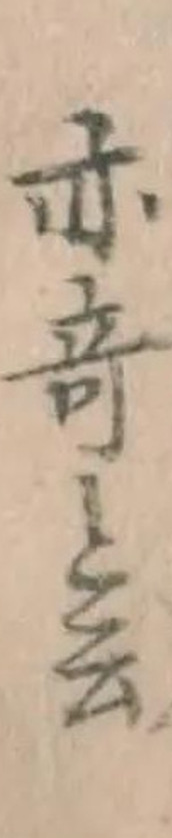亦奇と云
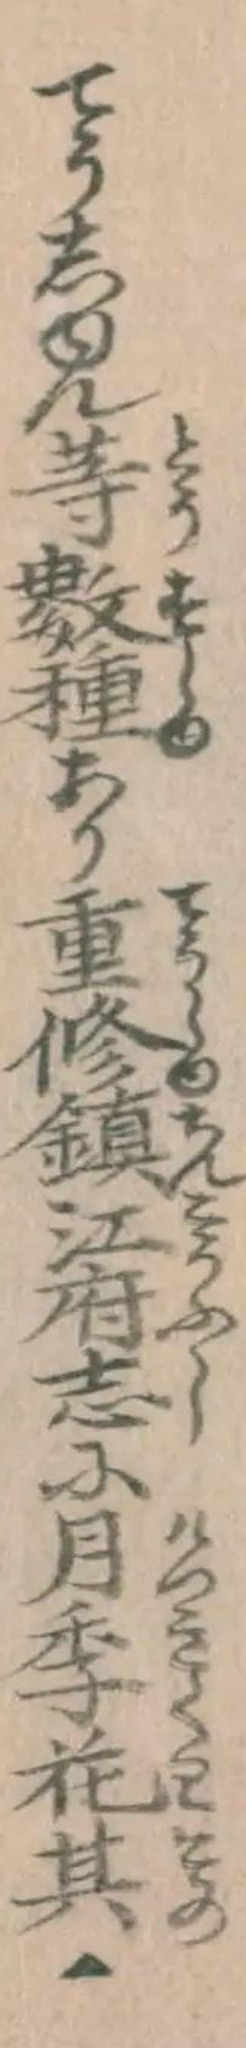てうしゆん等数種あり重修鎮江府志に月季花其▲
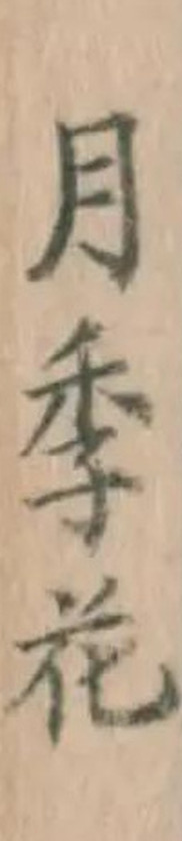月季花

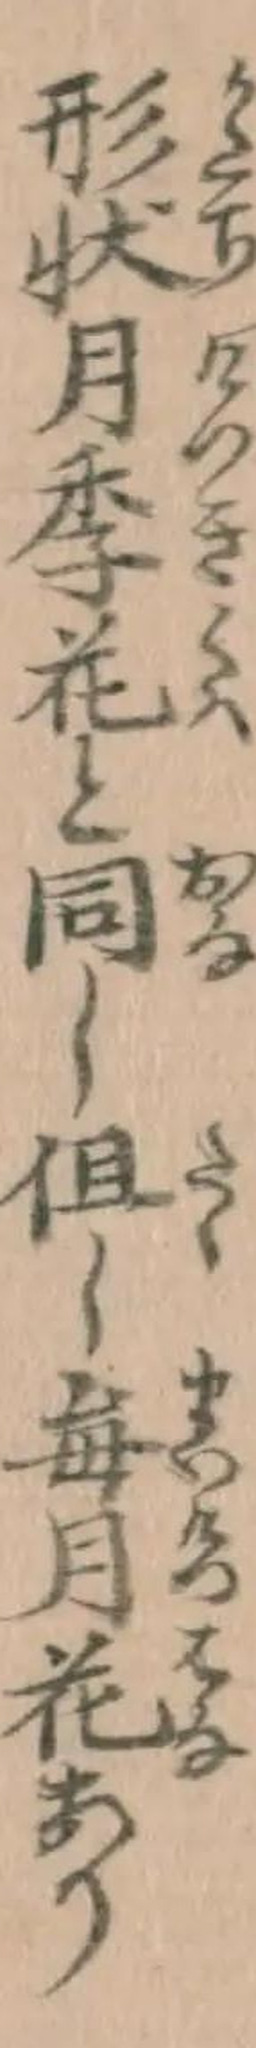形状月季花と同し但し毎月花あり
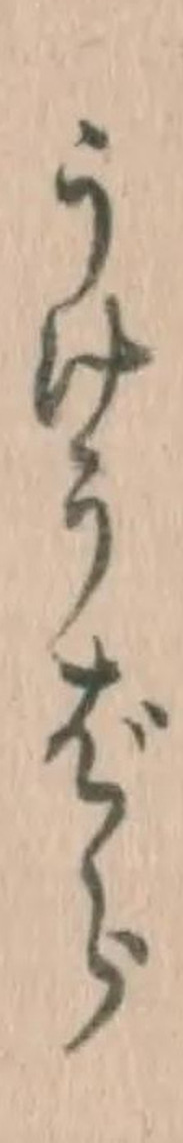うけうはら
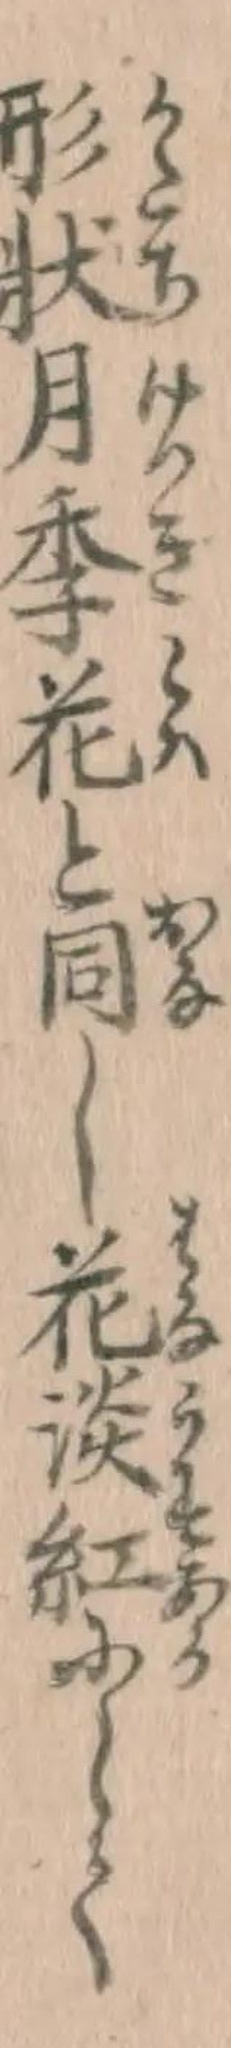形状月季花と同し花淡紅にして
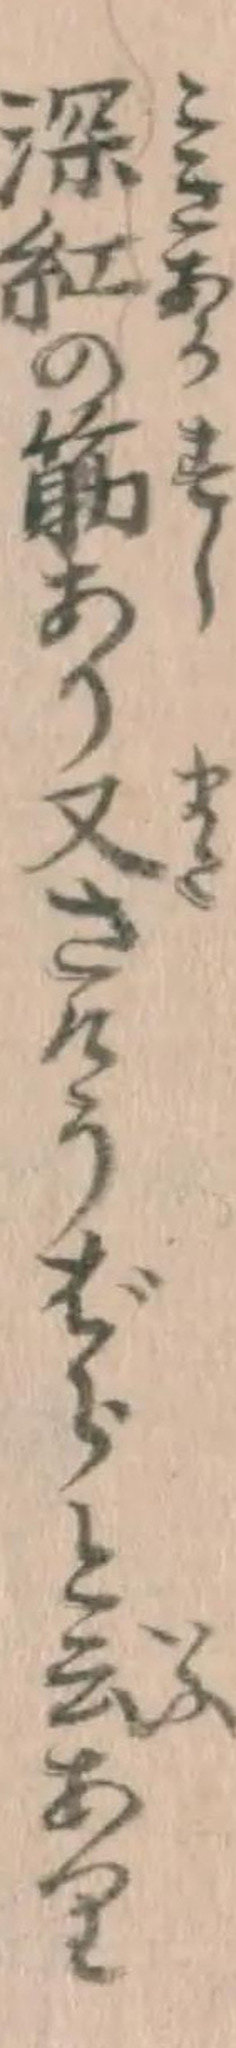深紅の筋あり又さけうばらと云あり
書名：本草図譜. 巻25-27
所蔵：国立国会図書館 National Diet Library, JAPAN
